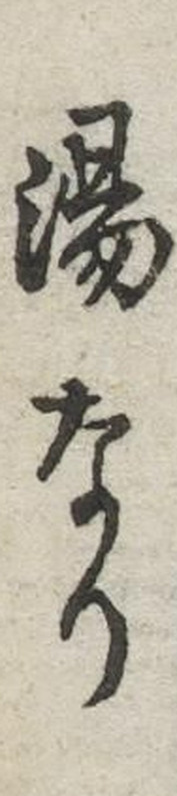湯なり

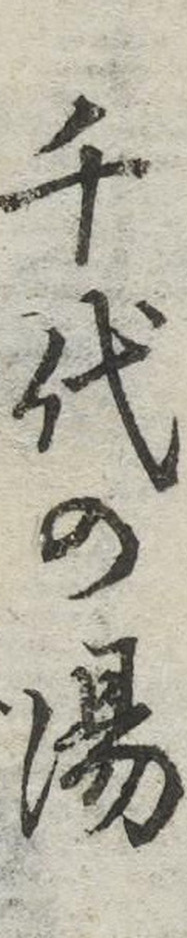千代の湯
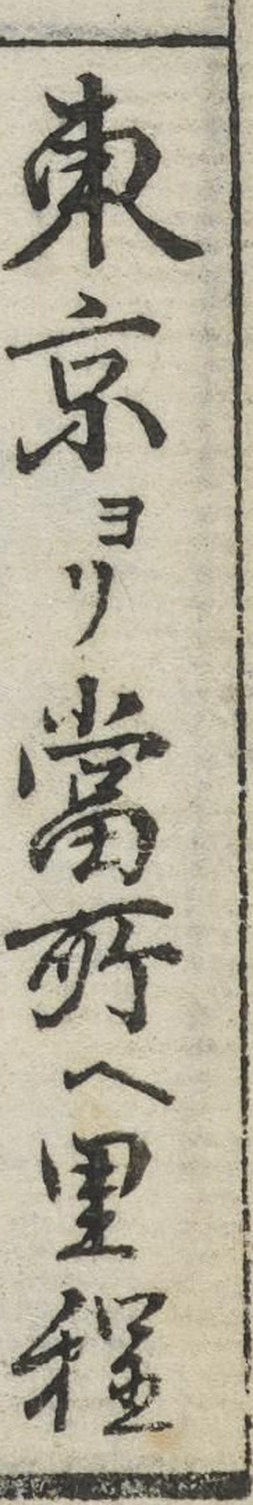東京ヨリ当所へ里程
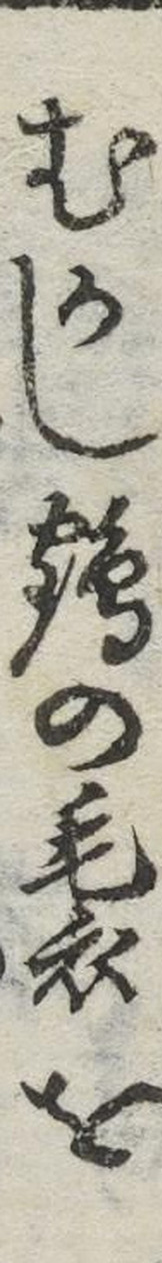むかし鶴の毛衣を
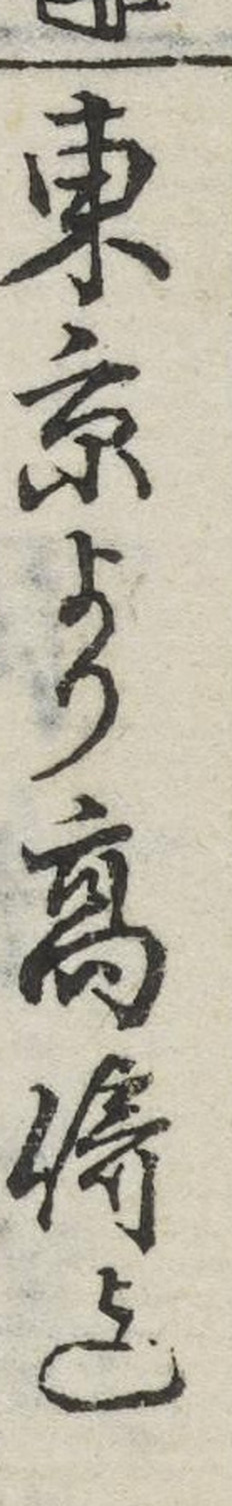東京より高崎迄
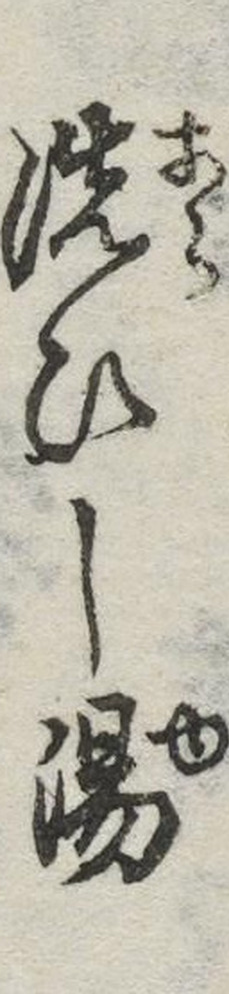洗ひし湯
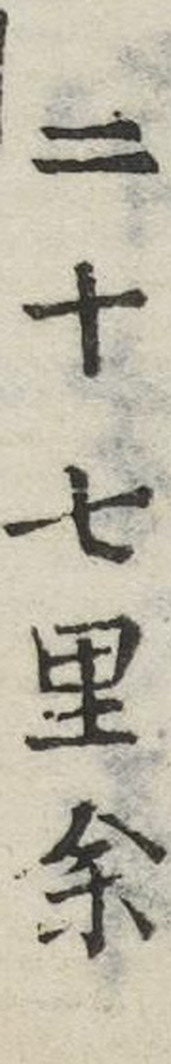二十七里余
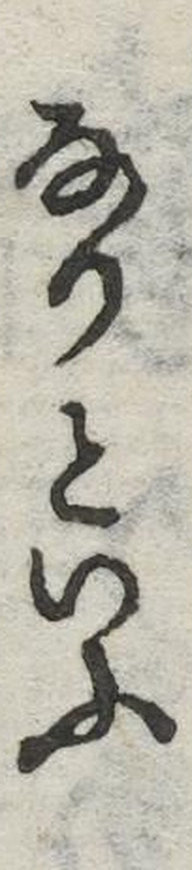なりといふ
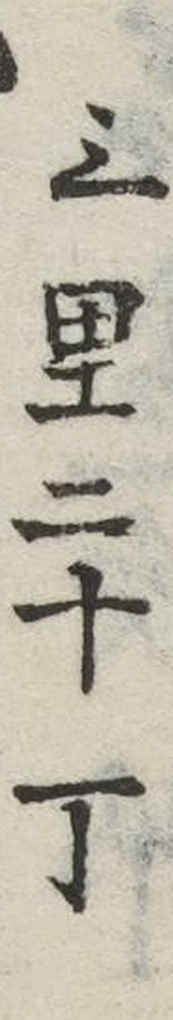三里二十丁
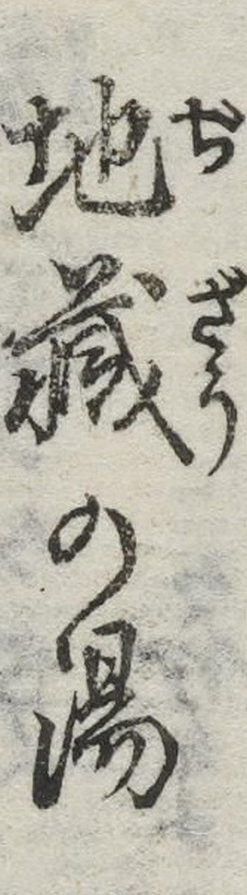地蔵の湯
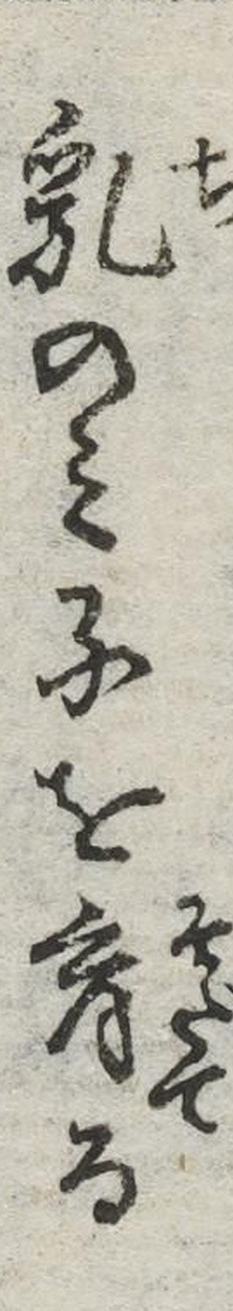乳のみ子を育る
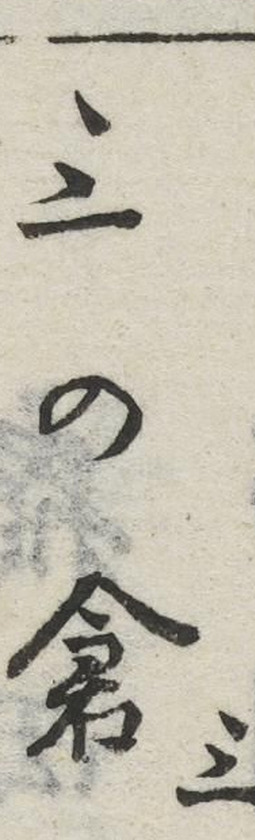三の倉
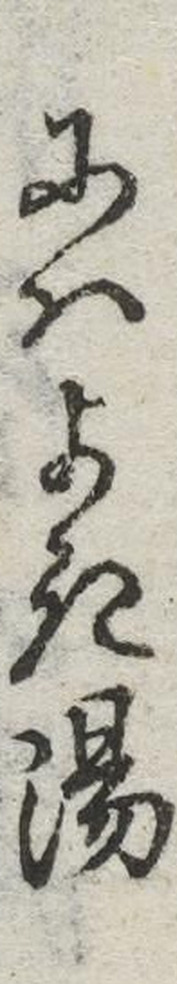にはよき湯
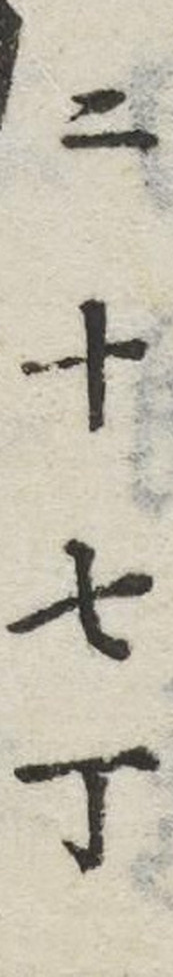二十七丁
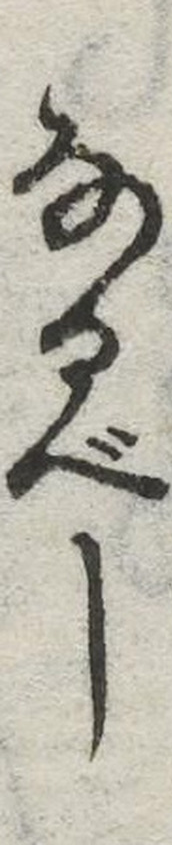なるべし
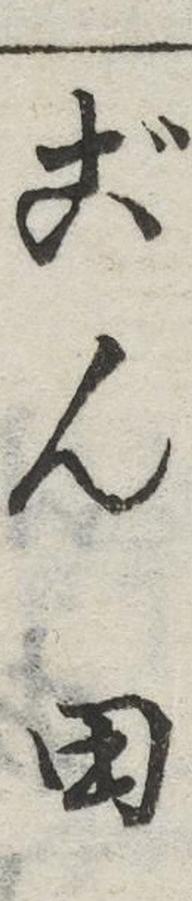ごん田
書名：諸國温泉遊覽記　全
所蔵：東京大学地震研究所図書室 Earthquake Research Institute Library, The University of Tokyo, JAPAN
